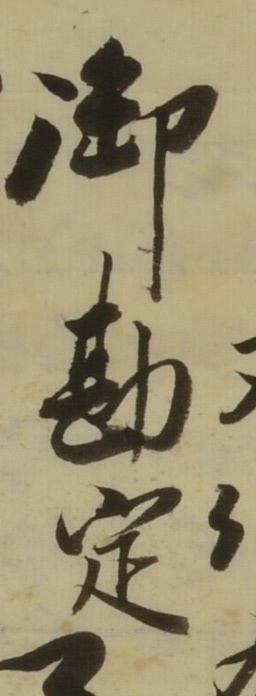御勘定
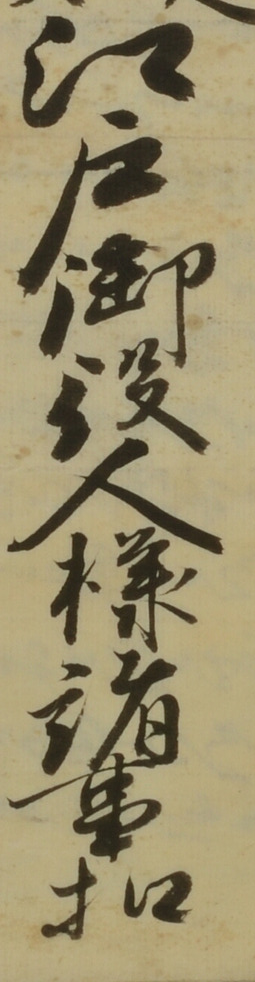江戸御役人様諸事控
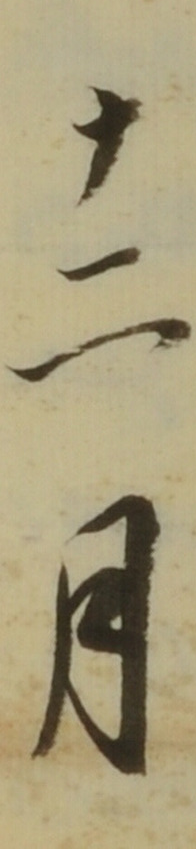十二月

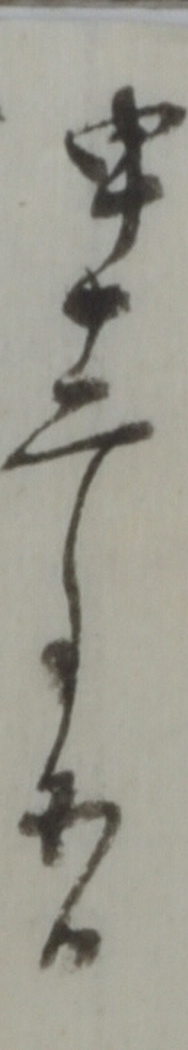申十二月五日
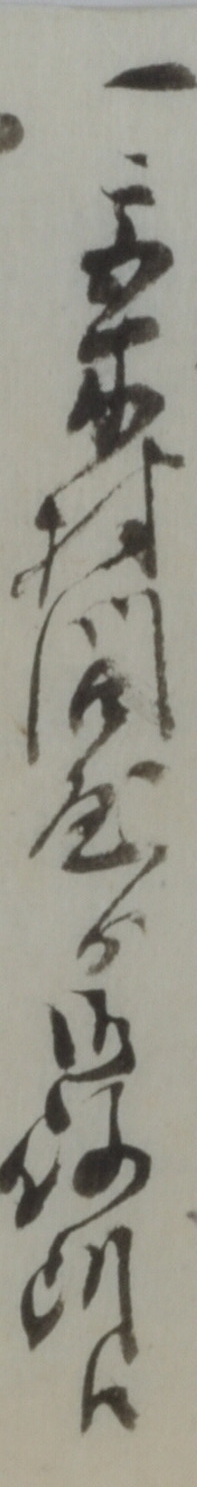一宮木村問屋ゟ御役所江
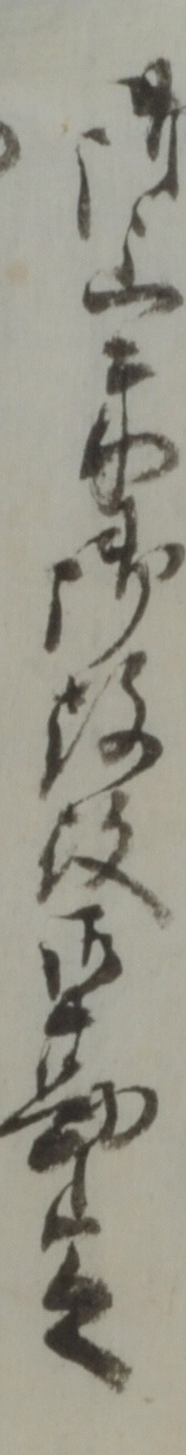御上米御改役御勘定
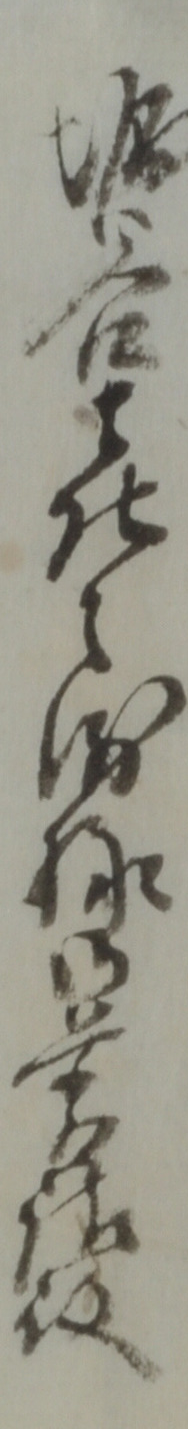堀谷喜兵衛様御普請役
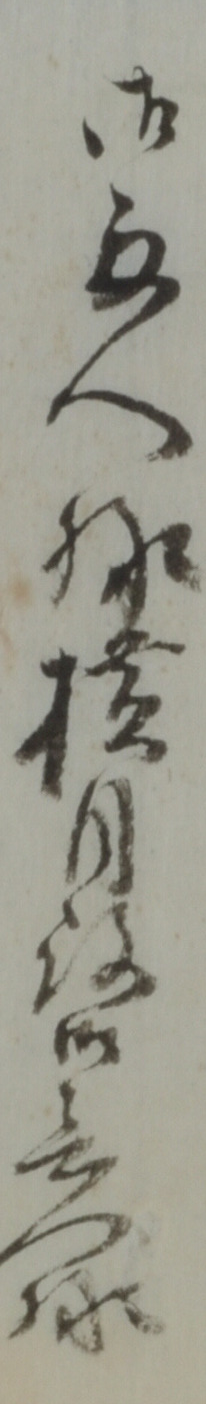御両人様横目役御壱人様
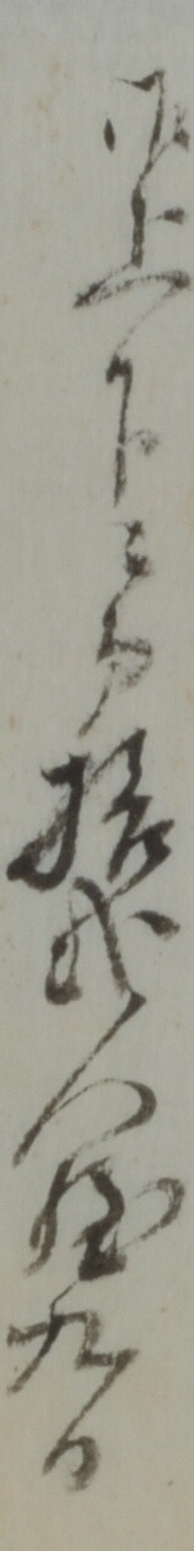御上下ニ而拾弐人程九日
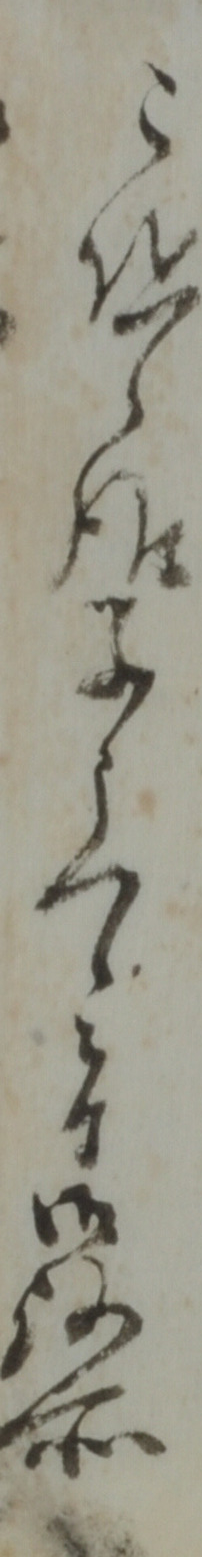被遊候様子申上候ニ付御役所
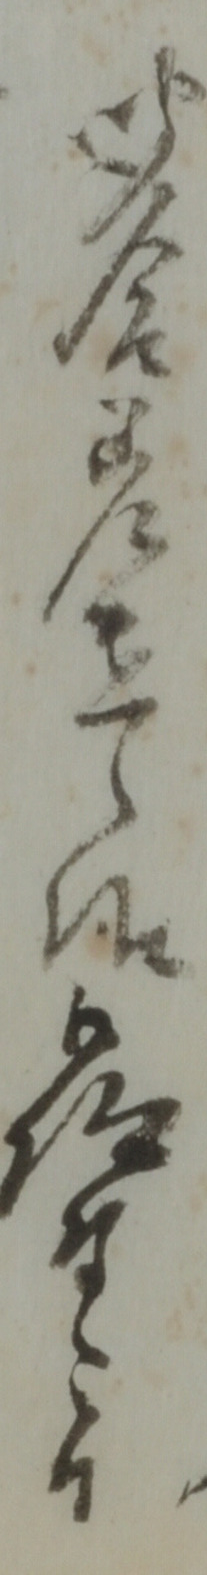聞合差遣候様被仰付候ニ付
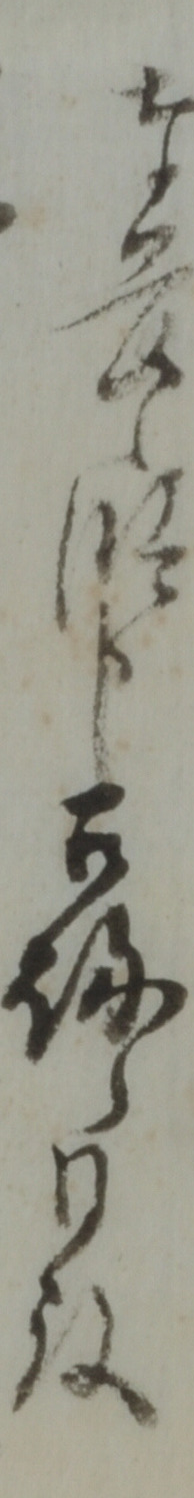奉畏候段申罷帰り同役
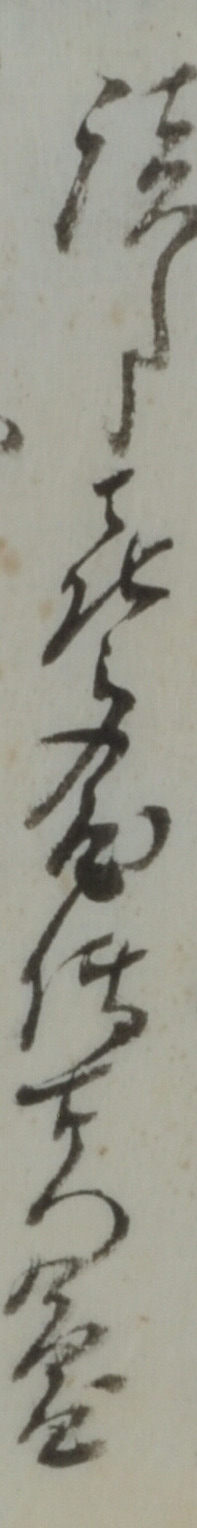談し申喜多屋伝右衛門富屋
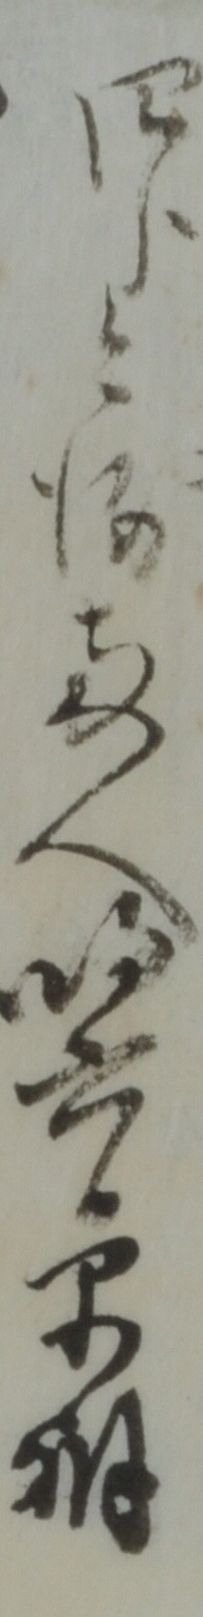四郎兵衛両人明六日早朝
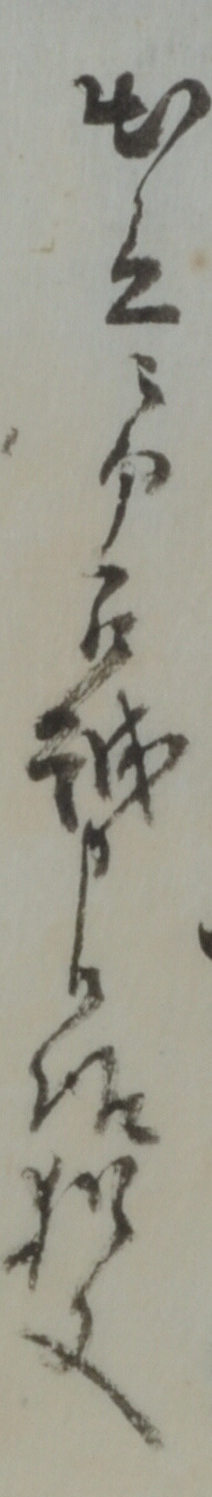出立ニ而罷越申候様猶又
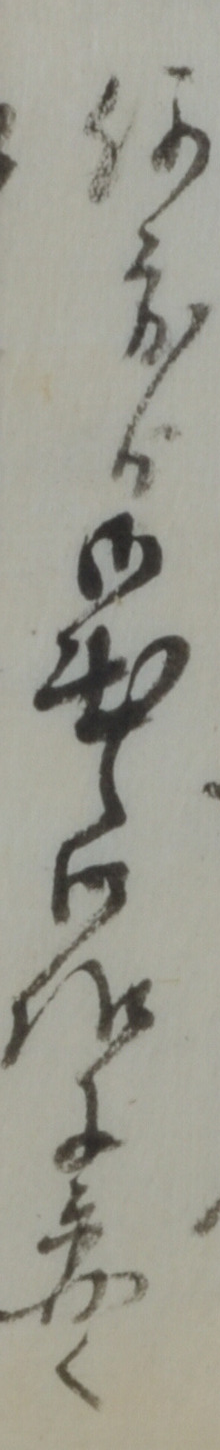何方より御出之御様子委く
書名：御勘定御普請役江戸御役人様諸事控
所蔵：伊那市立高遠町図書館・合同会社AMANE
